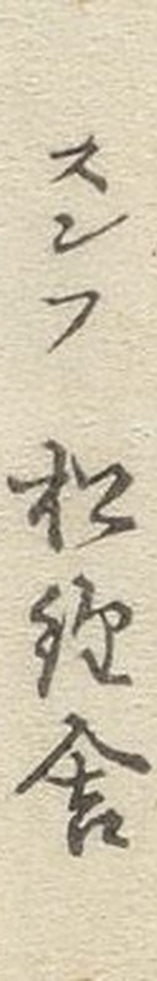スンフ松経舎
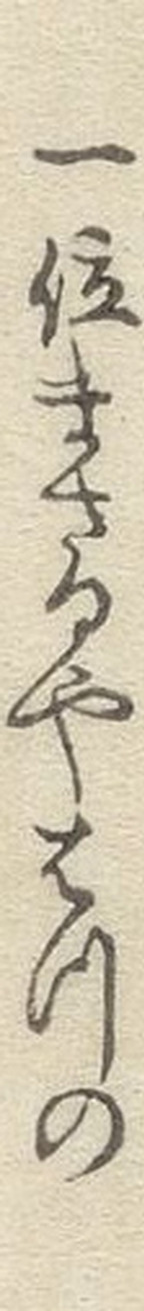一位まさるやはつの
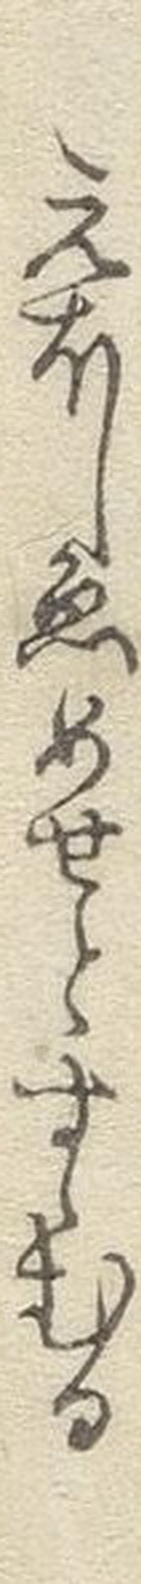えほし魚めせとすゝむる
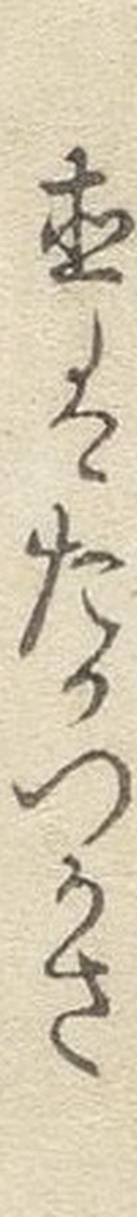直はたかつかさ
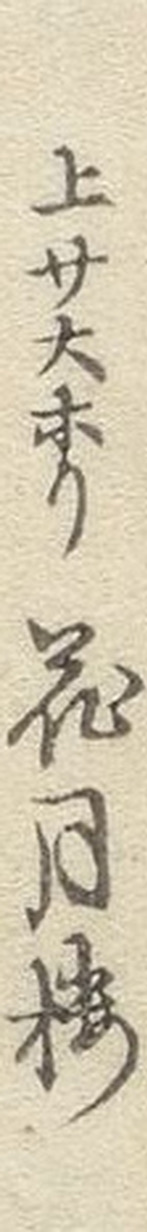上サ大ホリ花月楼
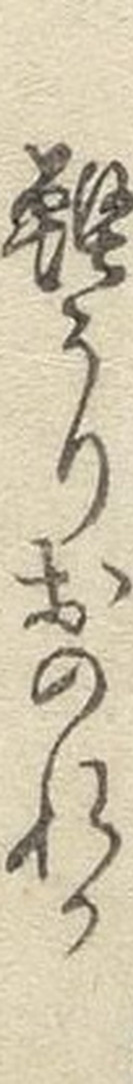鰹うりおのれか
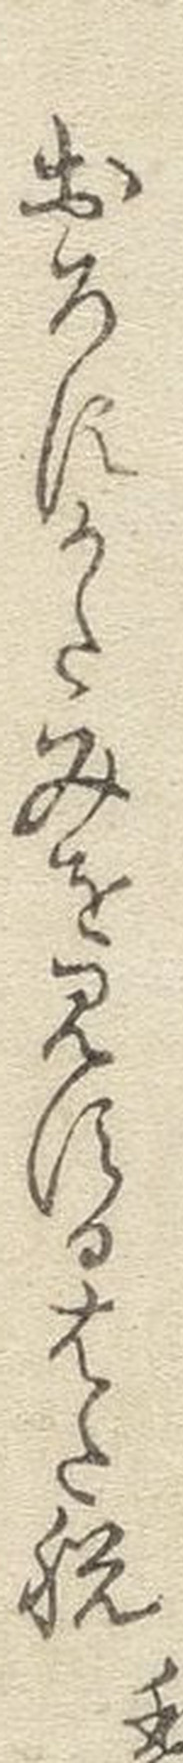おろすかたみを見するはた脱国盛
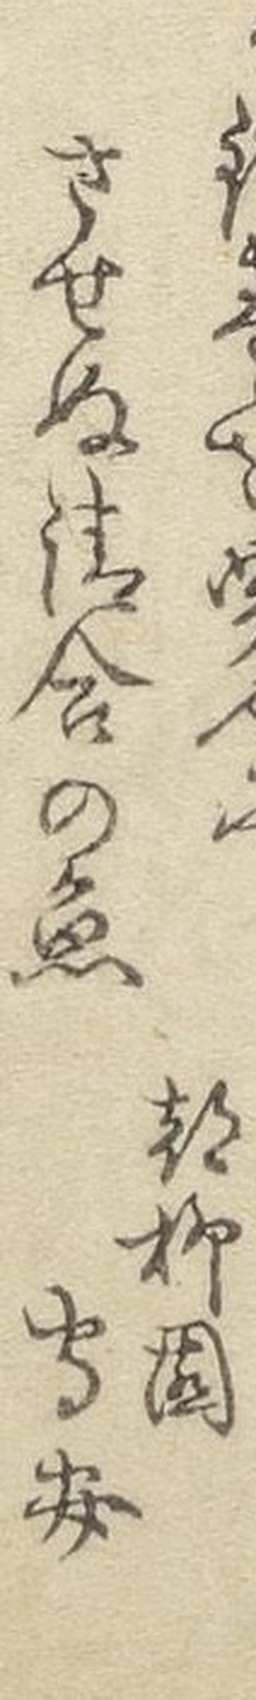させぬ請合の魚守安
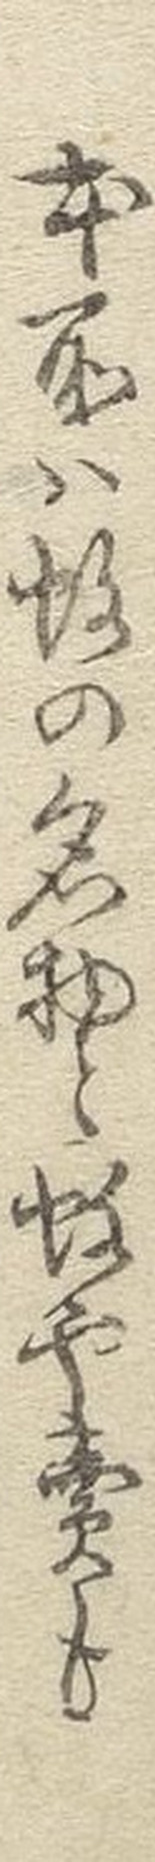本所は蚊の名物と蚊や売も
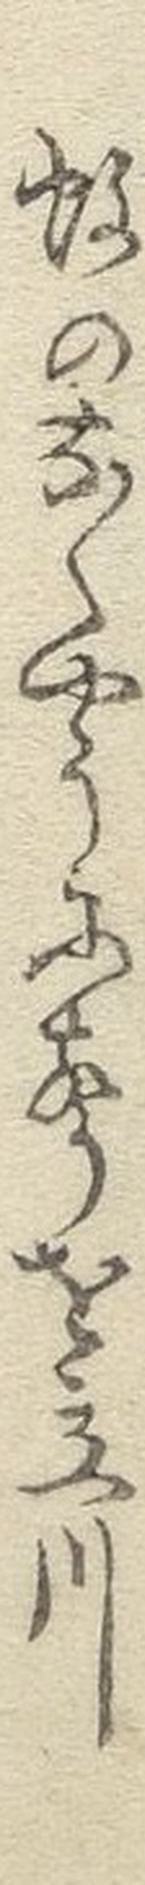蚊のなくやうに声を立つ
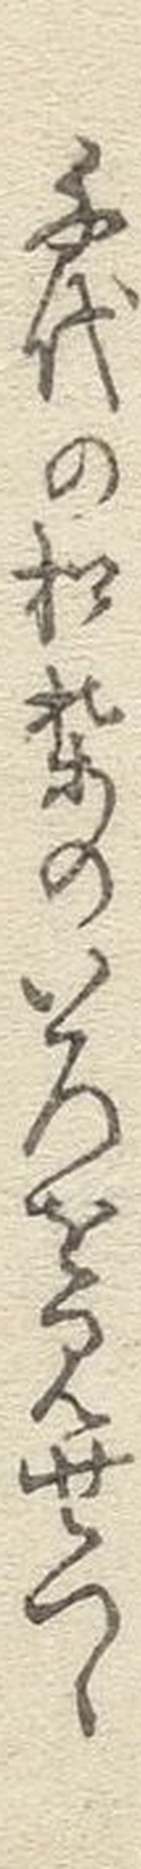千代の松葉のいろを見せつゝ
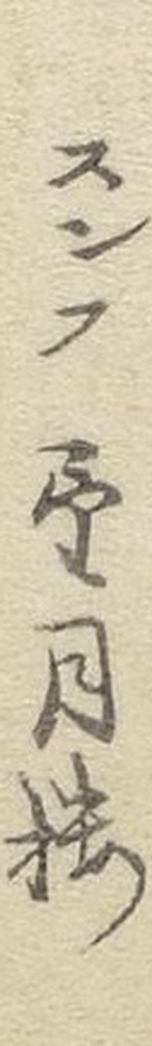スンフ望月楼
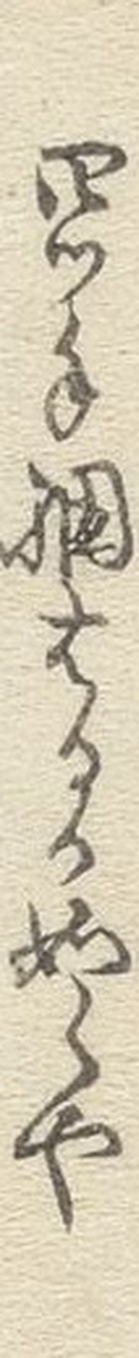四つ手網はるか如くや
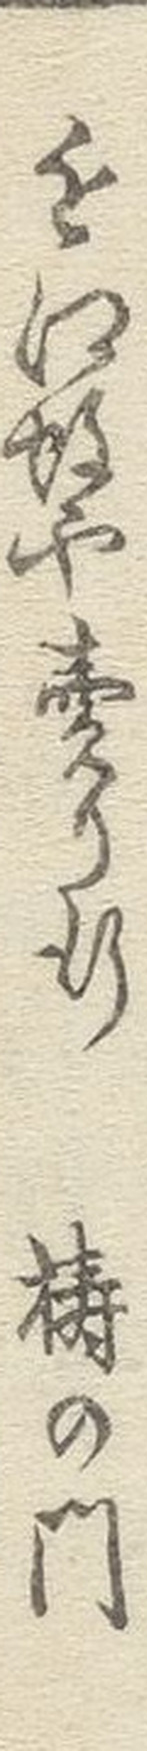近江蚊や売り行梼の門
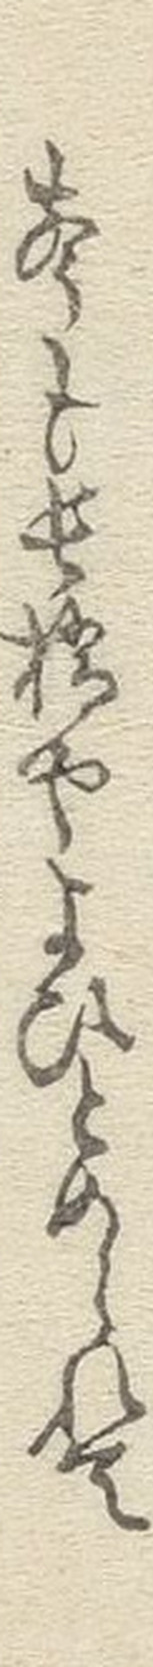声も長橋やよひとめられて
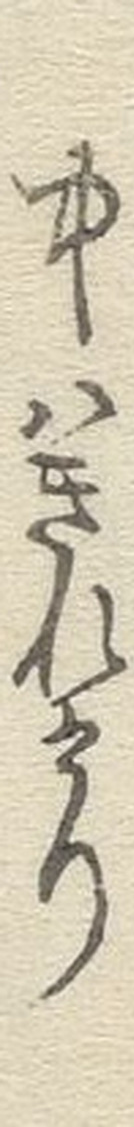中はきれけり
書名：Picture Album of People with Kyōka (Light Verse) (Kyōka shiki jinbutsu 狂歌四季人物)
